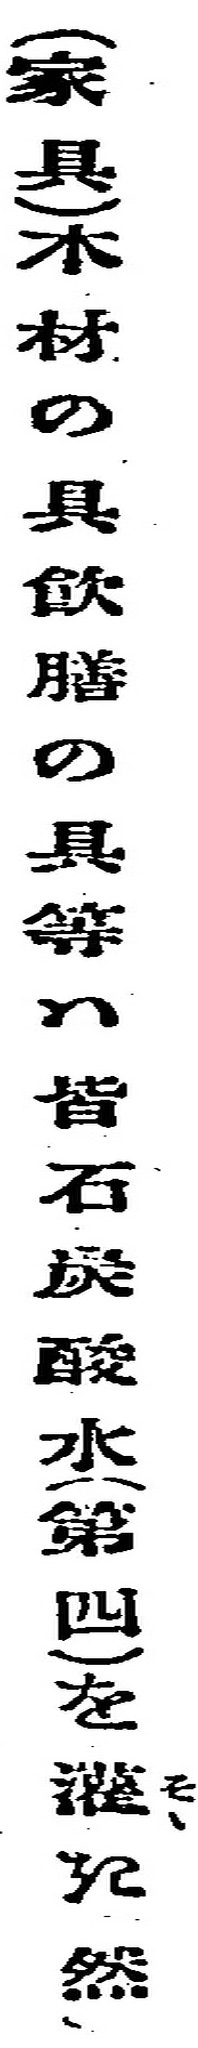(家具)木材の具飲膳の具等は皆石炭酸水(第四)を灌き然
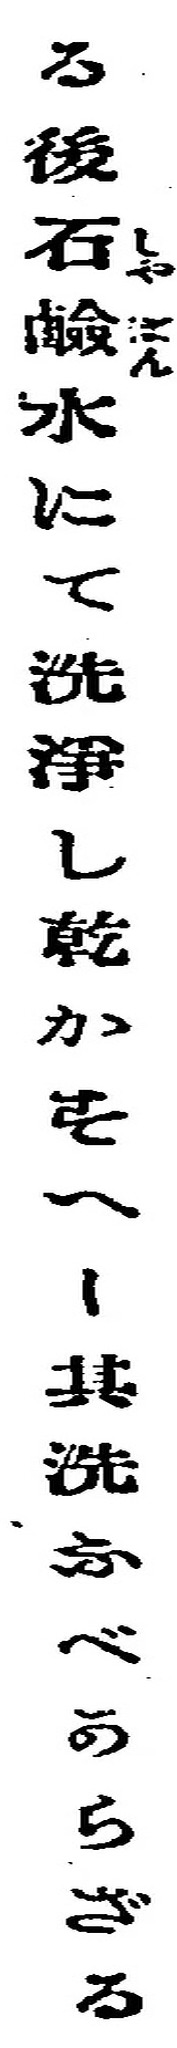る後石鹸水にて洗浄し乾かすへし其洗ふべからざる
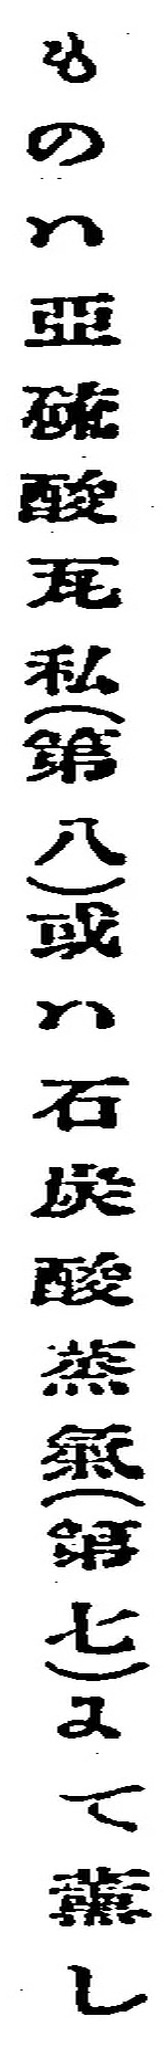ものは亜硫酸瓦私(第八)或は石炭酸蒸気(第七)にて薫し
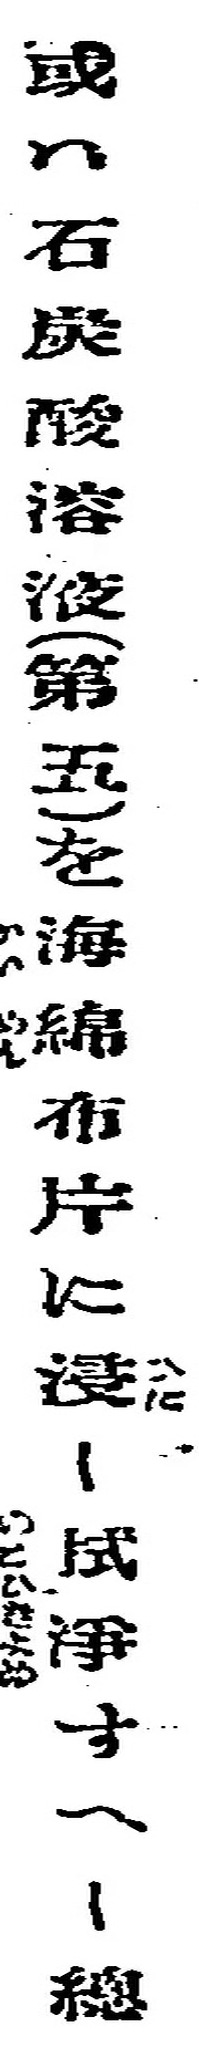或は石炭酸溶液(第五)を海綿布片に浸し拭浄すへし総
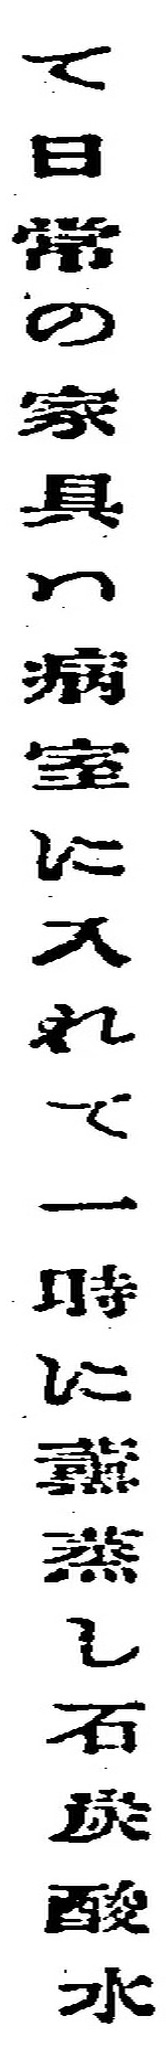て日常の家具は病室に入れて一時に薫蒸し石炭酸水
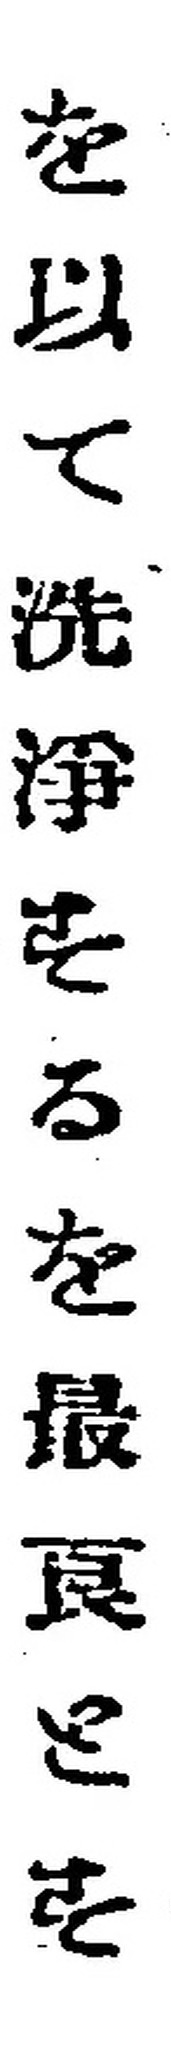を以て洗浄するを最良とす
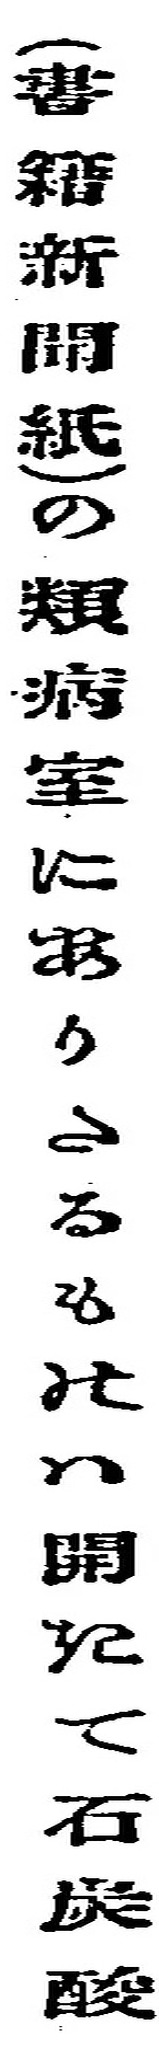(書籍新聞紙)の類病室にありたるものは開きて石炭酸
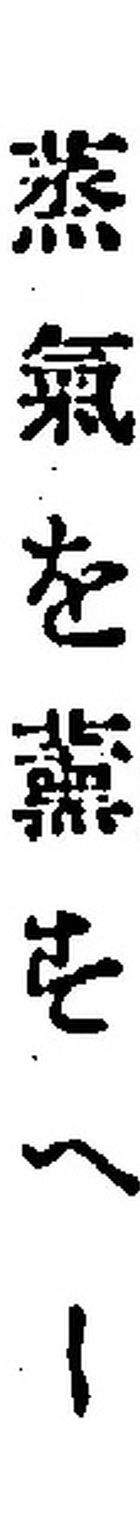蒸気を薫すへし

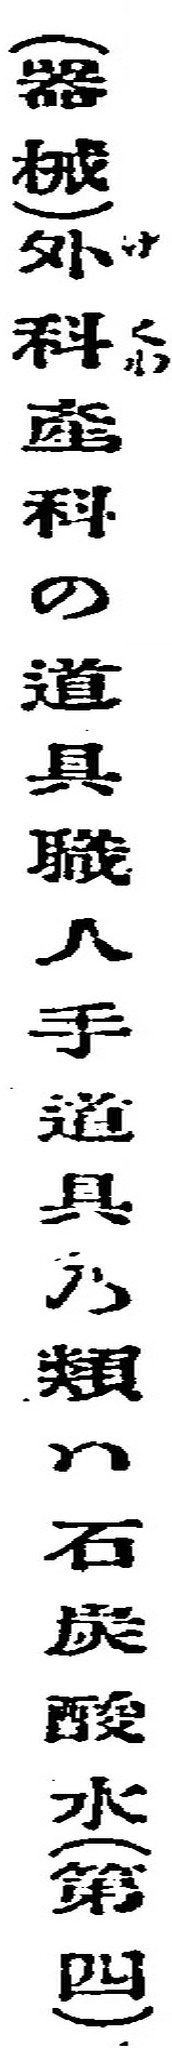(器械)外科産科の道具職人手道具の類は石炭酸水(第四)
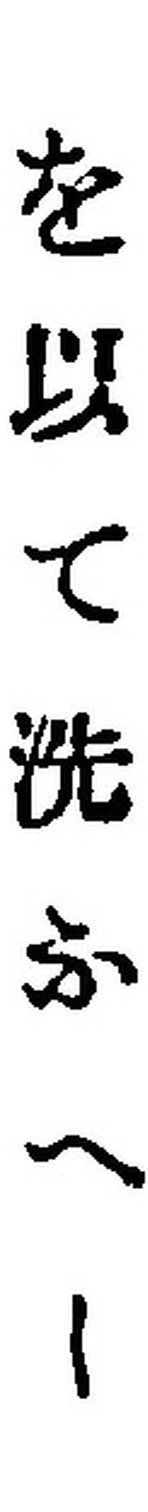を以て洗ふへし
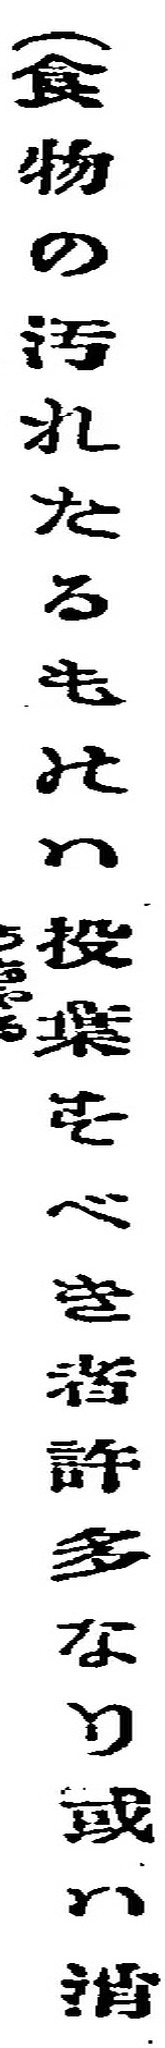(食物の汚れたるものは投棄すべき者許多なり或は消
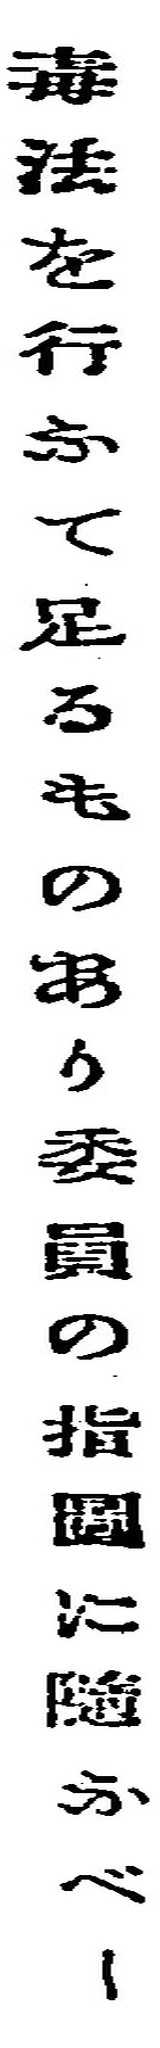毒法を行ふて足るものあり委員の指図に随ふべし
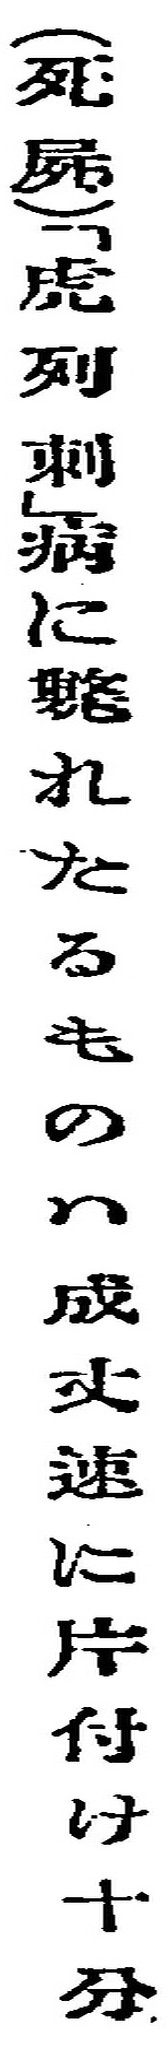(死屍)「虎列刺」病に斃れたるものは成丈速に片付け十分
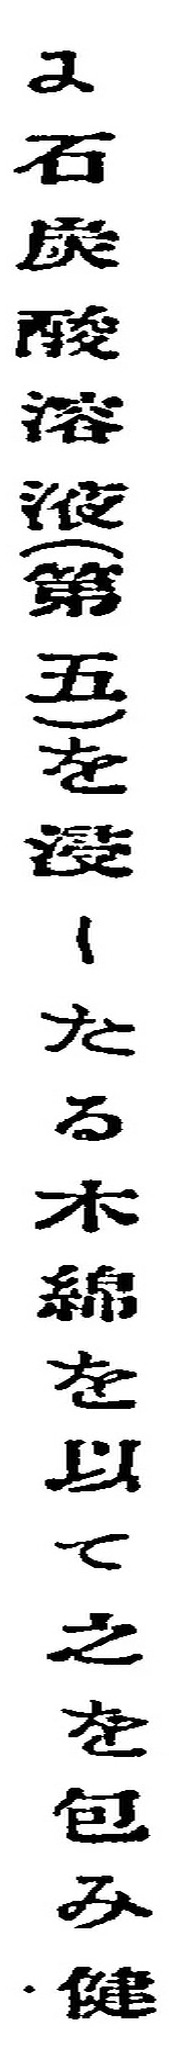に石炭酸溶液(第五)を浸したる木綿を以て之を包み健
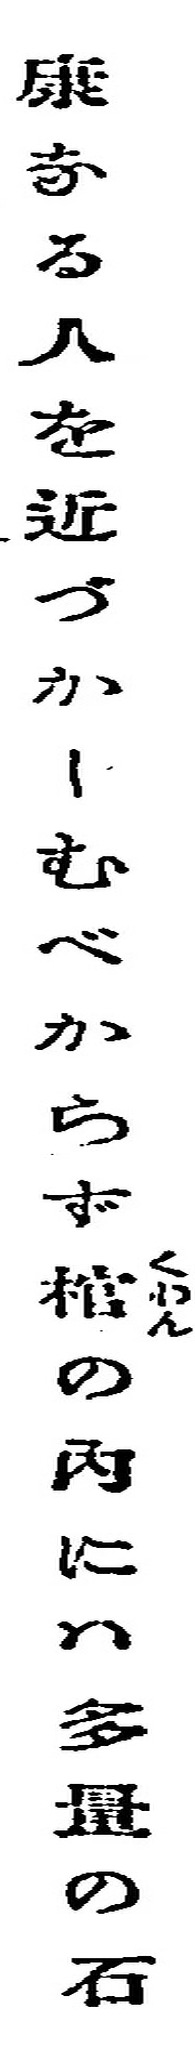康なる人を近づかしむべからず棺の内には多量の石
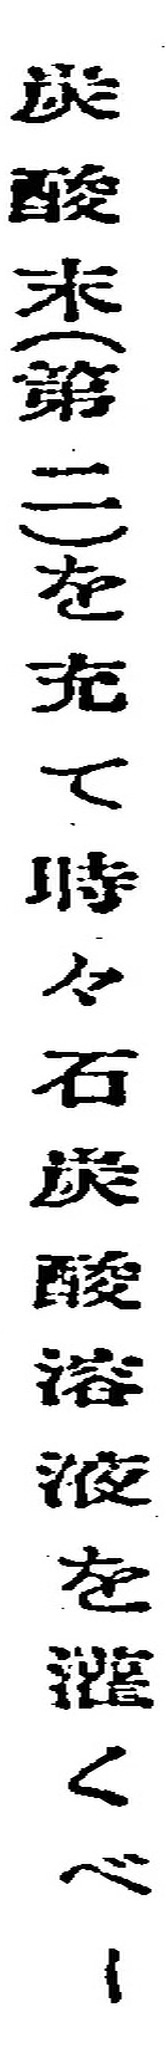炭酸末(第二)を充て時々石炭酸溶液を灌くべし
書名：これら病予防心得
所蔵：国立国会図書館 National Diet Library, JAPAN
